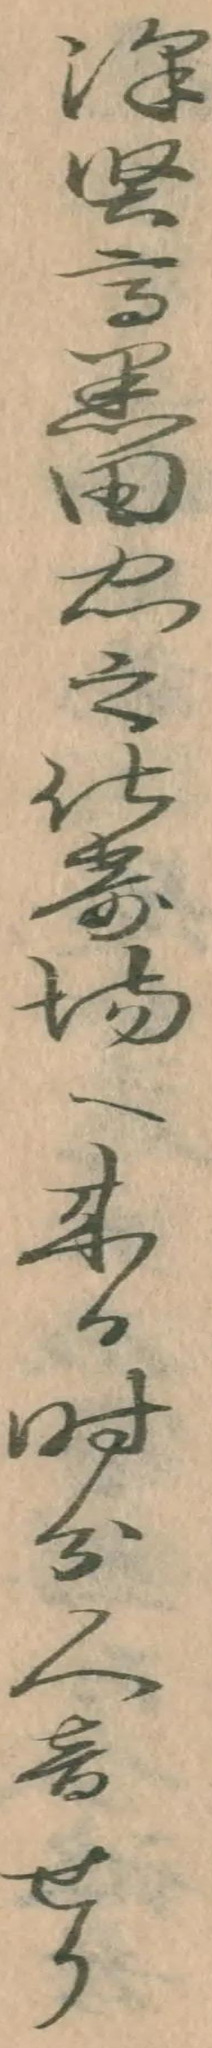沢堅高黒田忠郷仕寄場へ来る時分人音せり
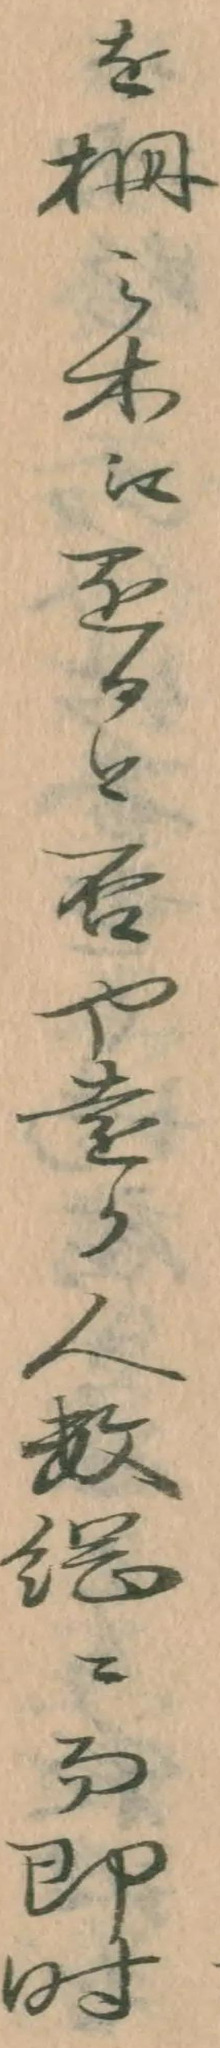を柵之木江懸ると否や遠く人数綱に而即時
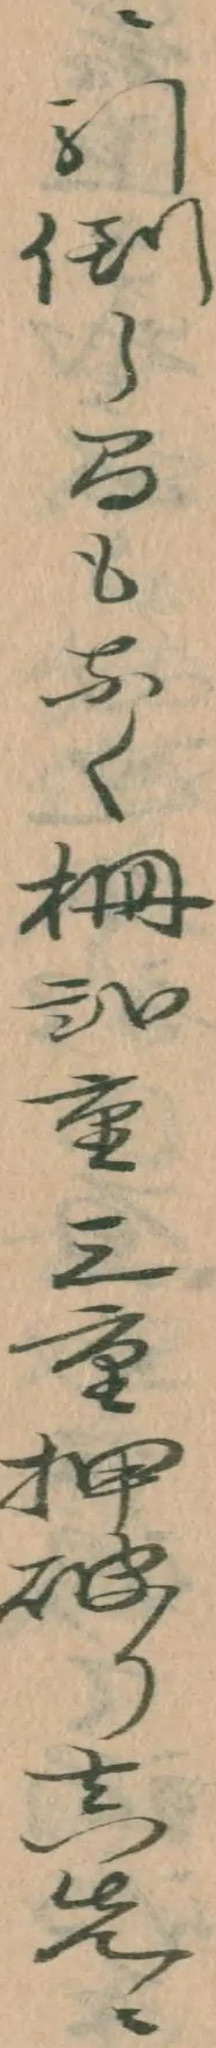に引倒し間もなく柵弐重三重押破り真先に
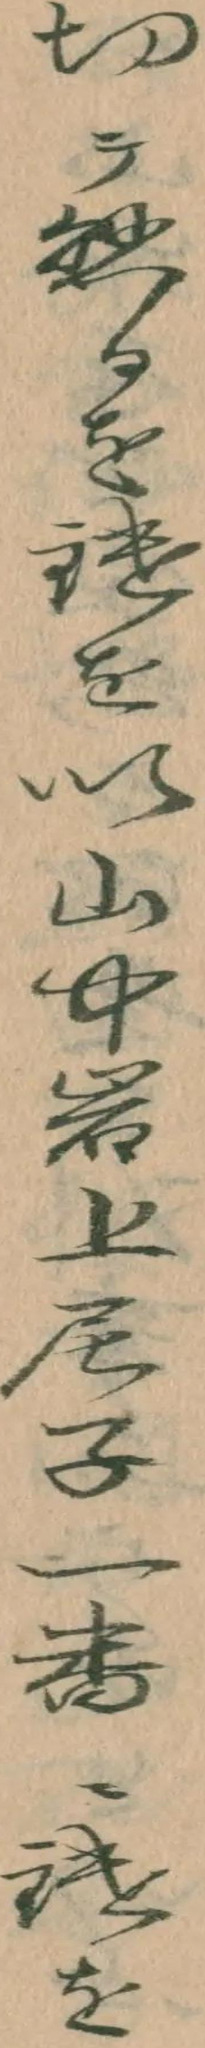切て懸るを鑓を以山中岩上尼子一番に鑓を
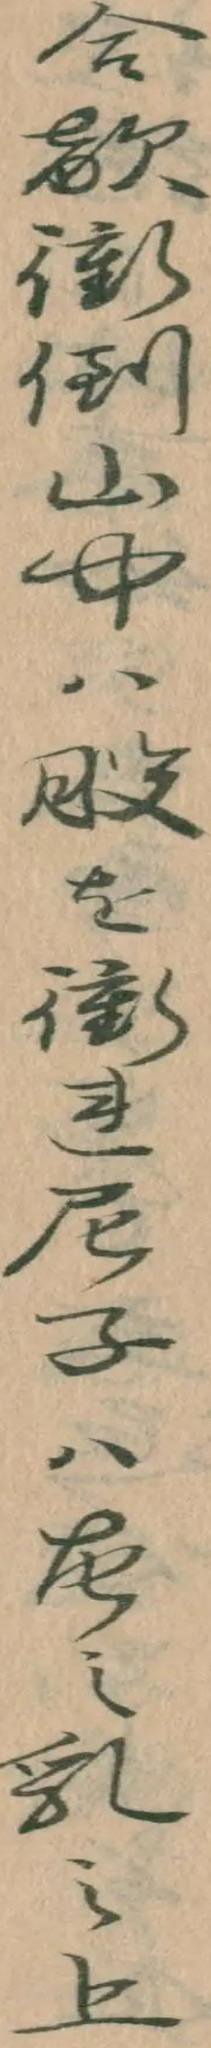合敵衛倒山中は股を衛連尼子は左之乳之上
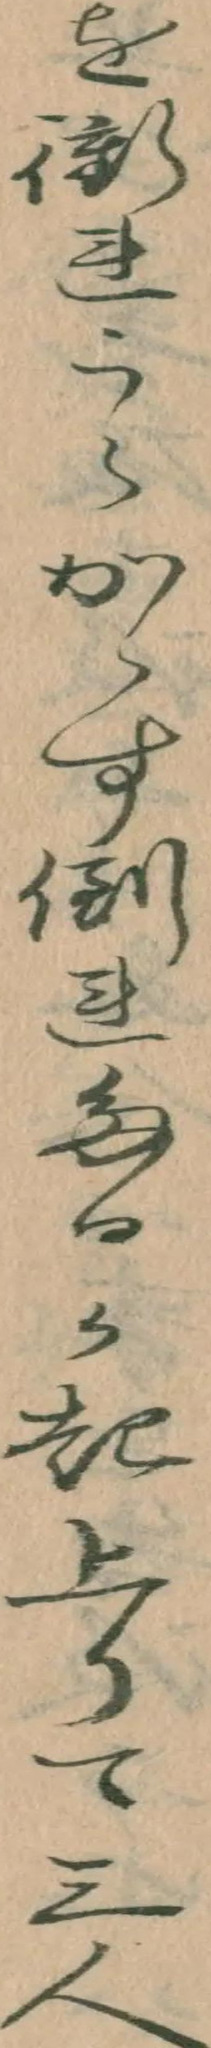を衛連うらかゝす倒連多るか起上りて三人
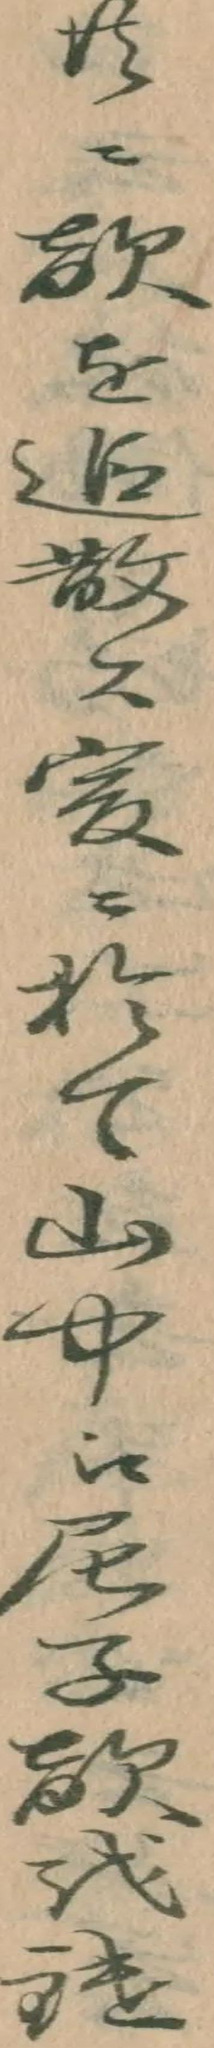共に敵を追散す爰に於て山中江尼子敵越鑓
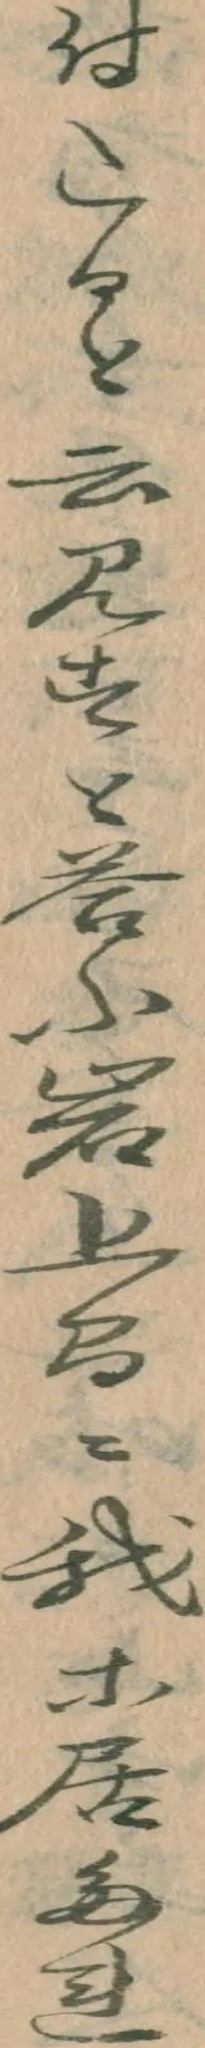付たると云見春と答ふ岩上間に我等居多連
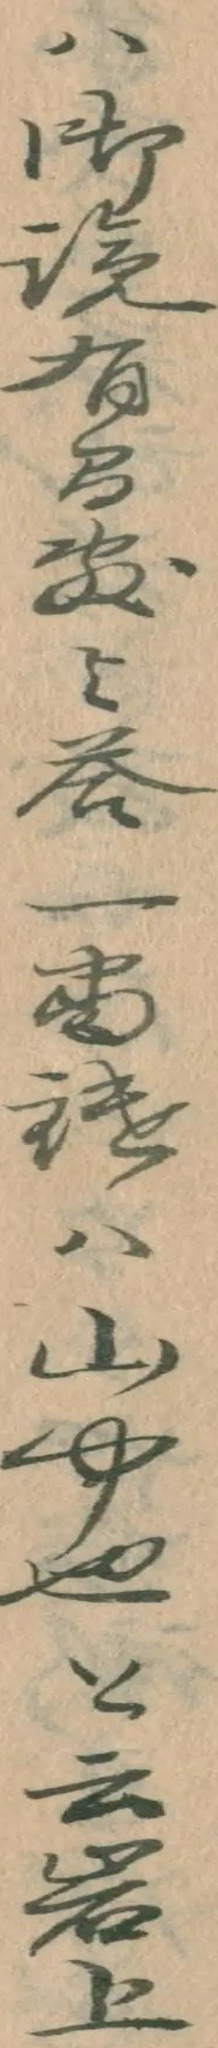は御覧有間敷与答一番鑓は山中也と云岩上
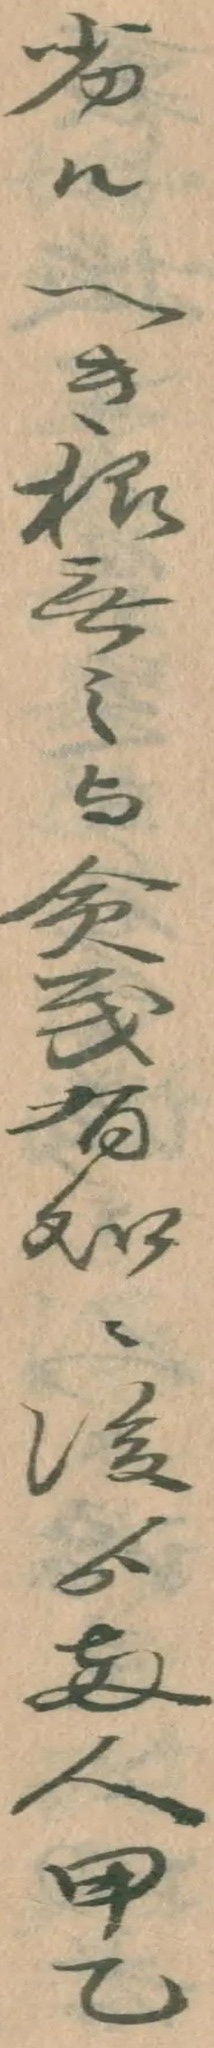劣るへき様無之旨僉議有処に後ゟ両人甲乙
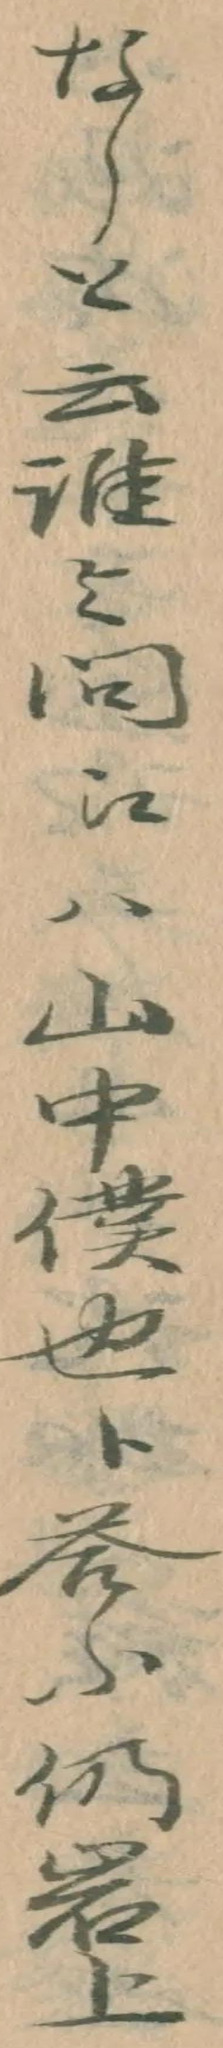なしと云誰与問江は山中僕也と答ふ仍岩上
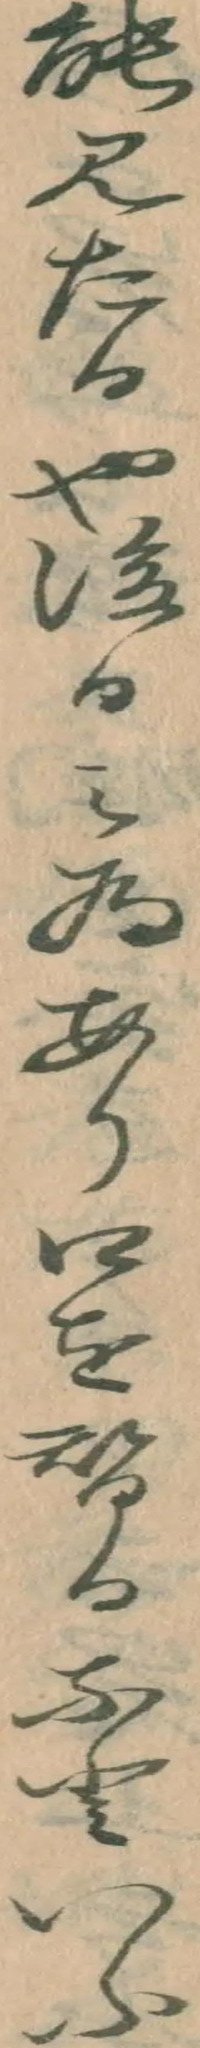能見たるや後日之為あり口を替るな登いふ

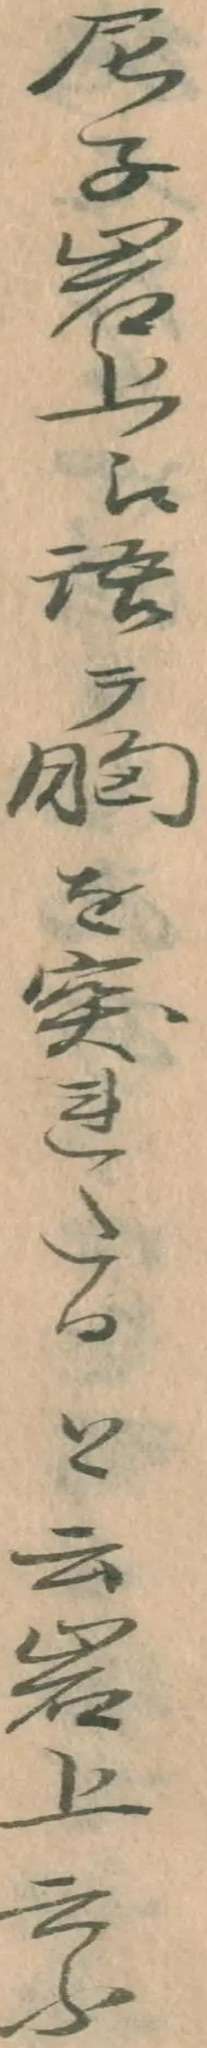尼子岩上江語て胸を突連たると云岩上云ふ
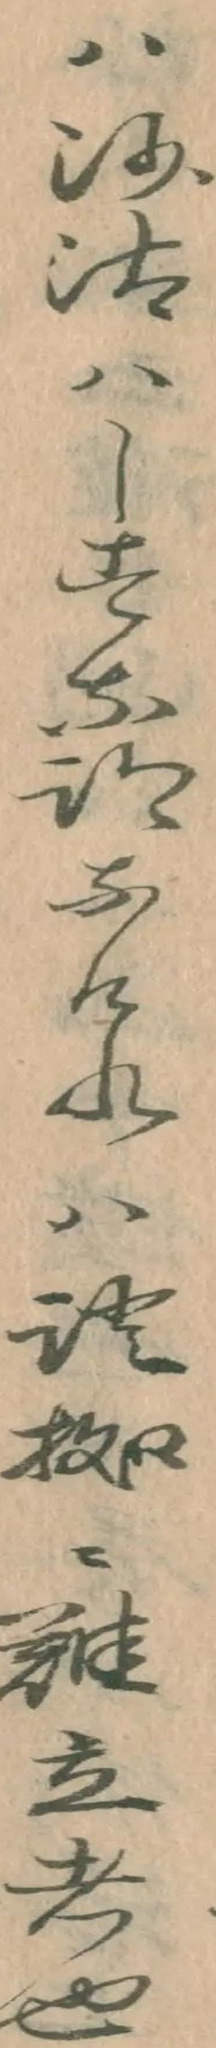は沙汰はし春な跡なけれは證拠に難立者也
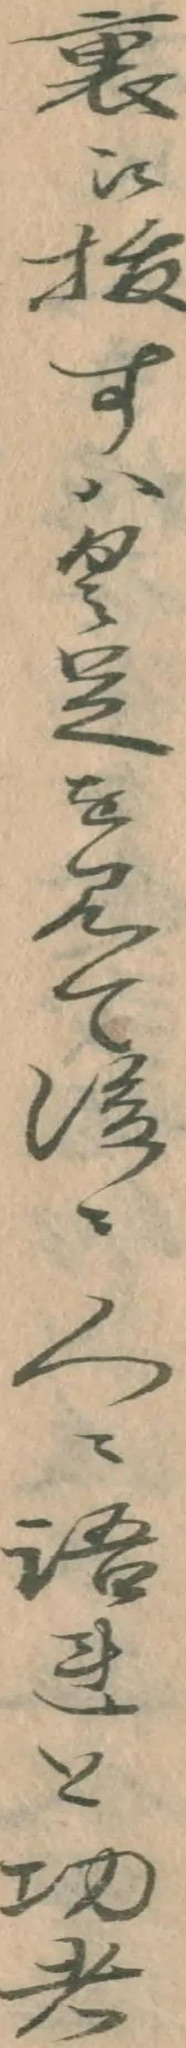裏江抜すは具足を見て後に人に語連と功者
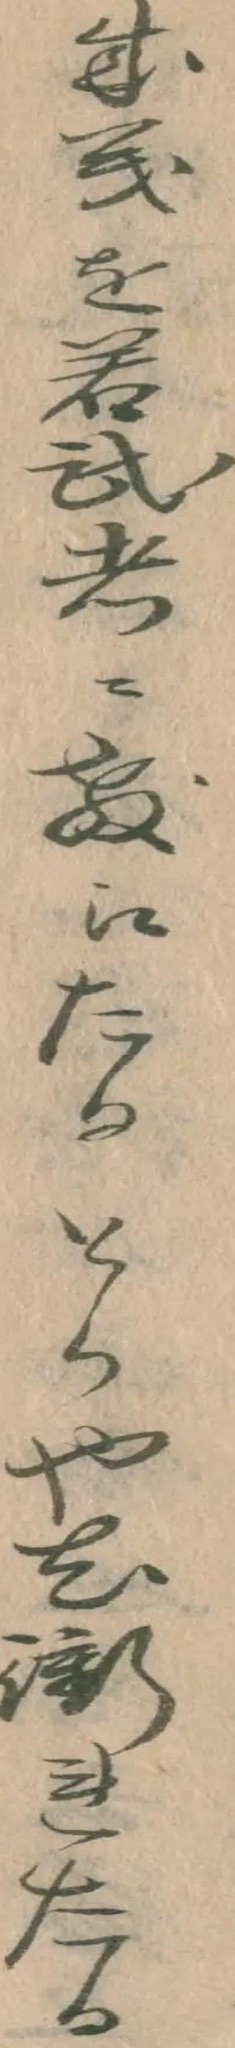成義を若武者に教江たるとかや尤漸連たる
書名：切支丹御退治記 49巻. [7]
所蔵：国立国会図書館 National Diet Library, JAPAN
